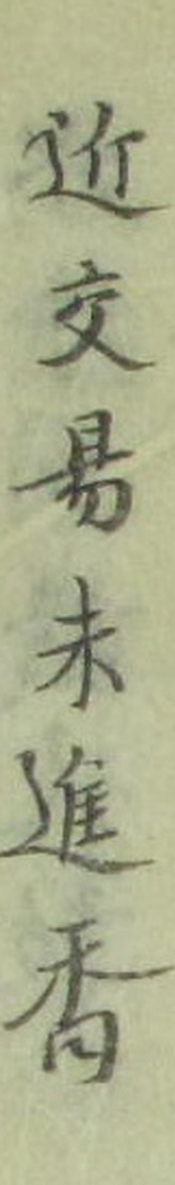近交易未進香王
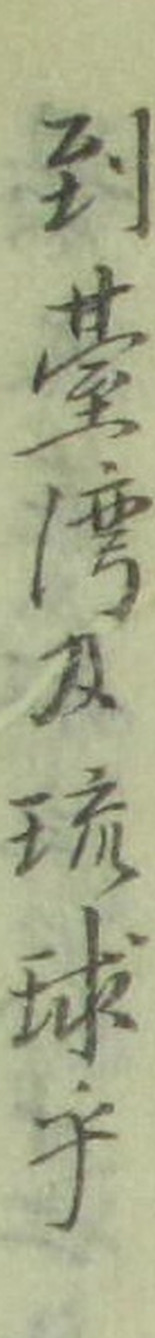到台湾及琉球乎鳴
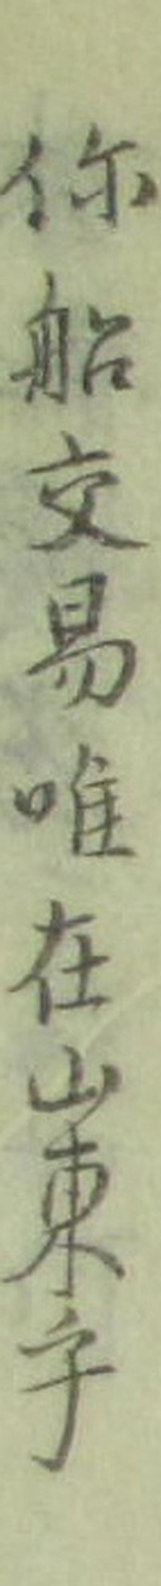你船交易唯在山東乎鳴
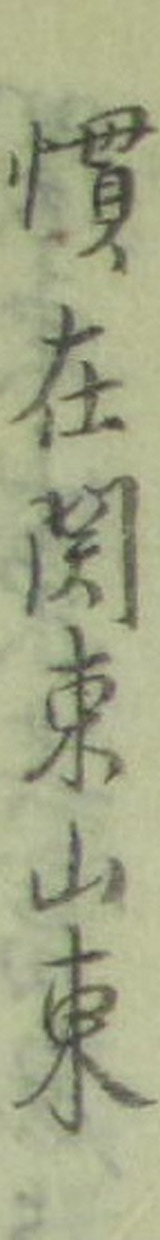慣在関東山東王

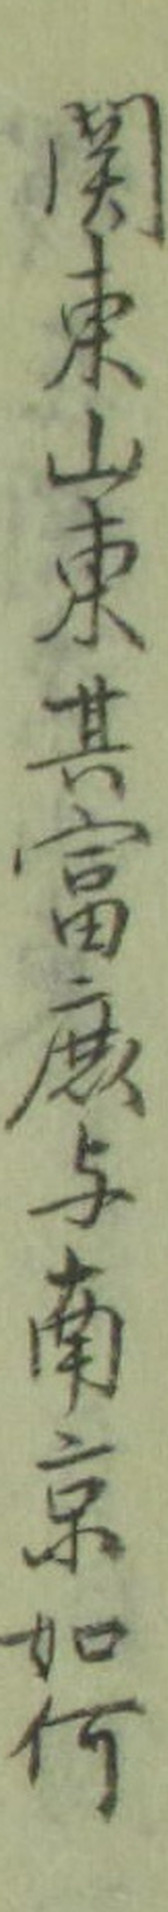関東山東其富庶与南京如何鳴
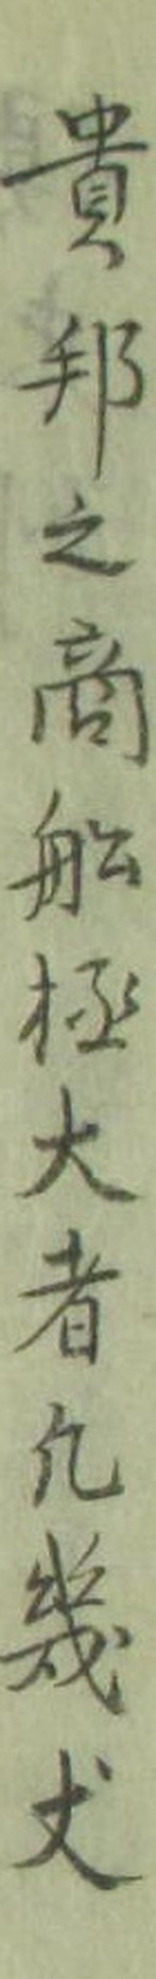貴邦之商船極大者凡幾丈鳴
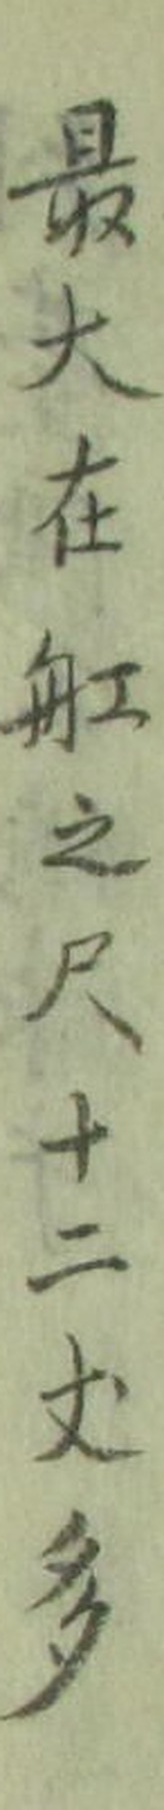最大在舡之尺十二丈多王
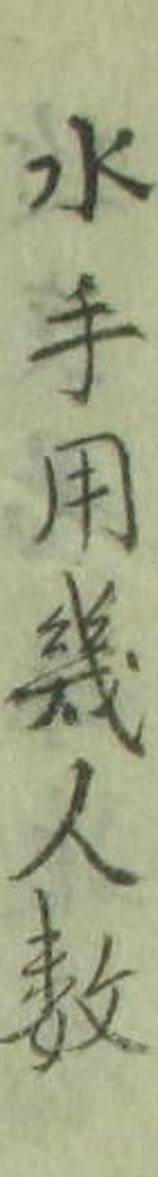水手用幾人数鳴
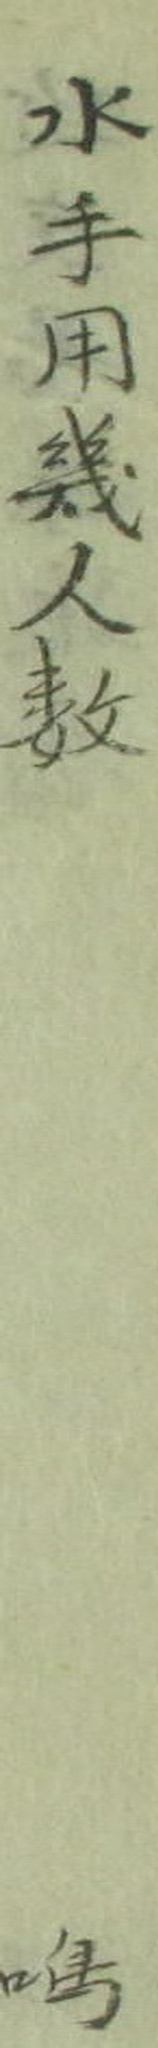水手用幾人数鳴
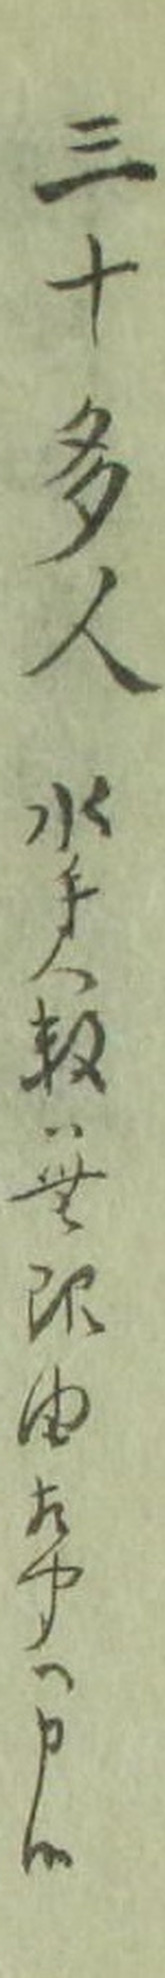三十多人水手人数ハ無限由相聞へ申候王
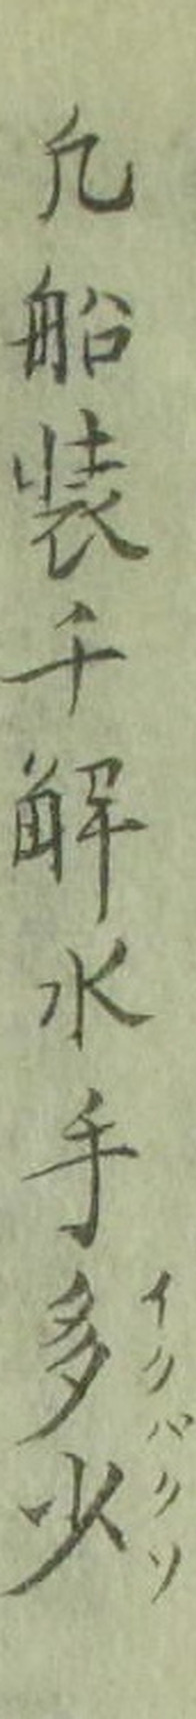凡船装千解水手多少鳴
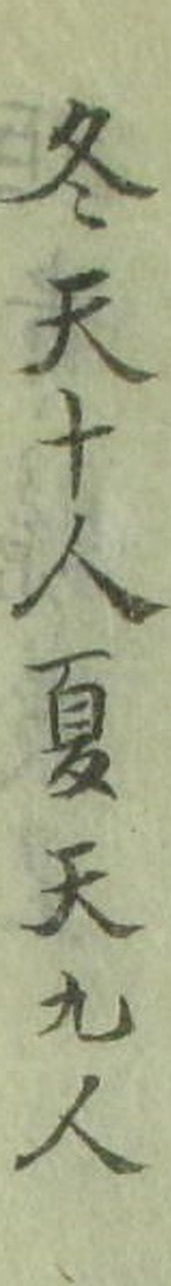冬天十人夏天九人王
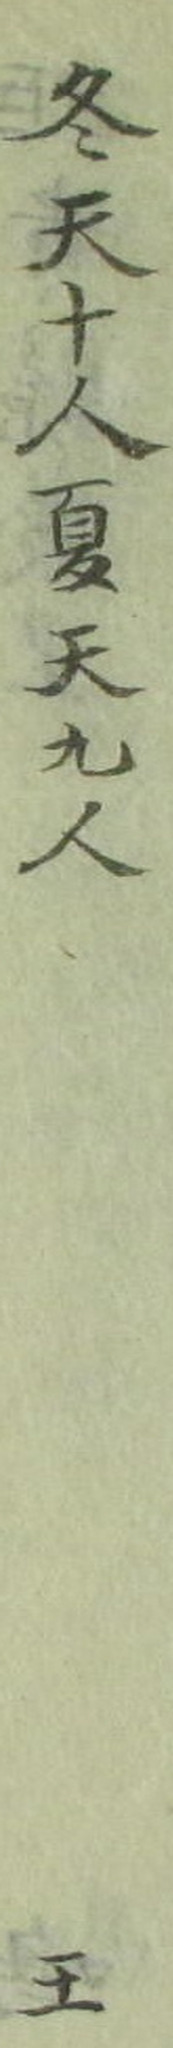冬天十人夏天九人王
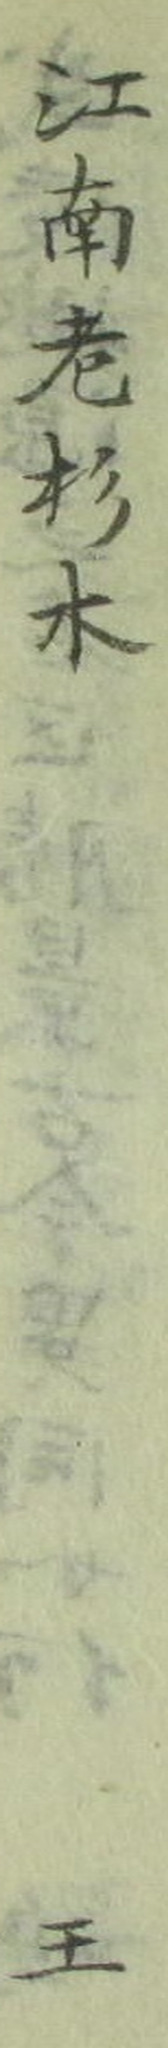江南老杉木王
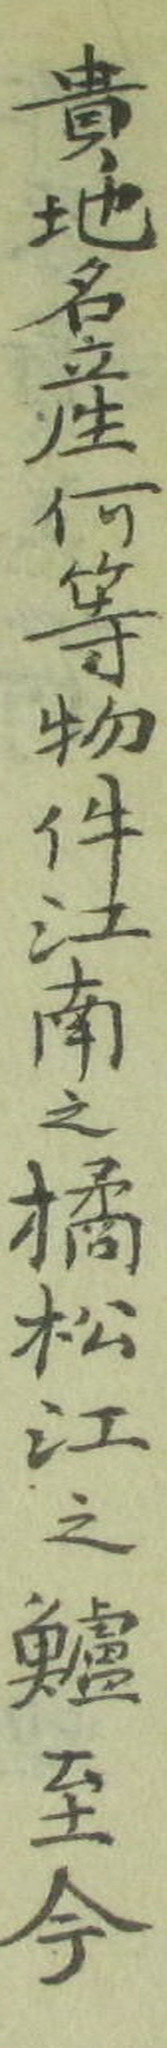貴地名産何等物件江南之橘松江之鱸至今
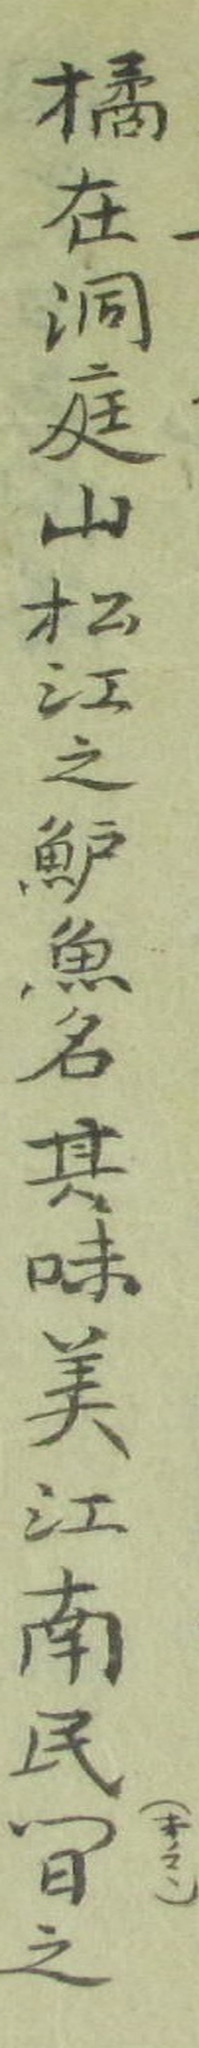橘在洞庭山松江之魲魚名其味美江南民間之
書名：紀州九木浦庄屋記録 四
